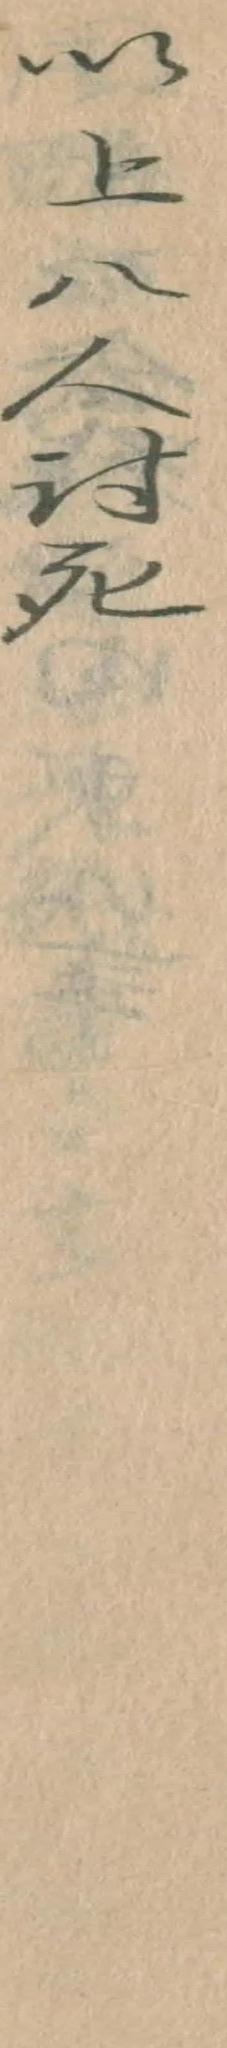以上八人討死
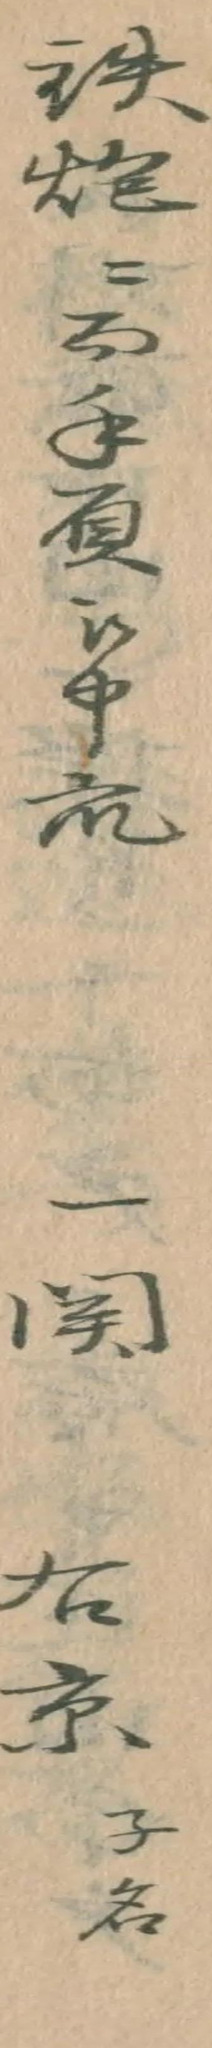鉄炮に而手負被申衆一関右京子名
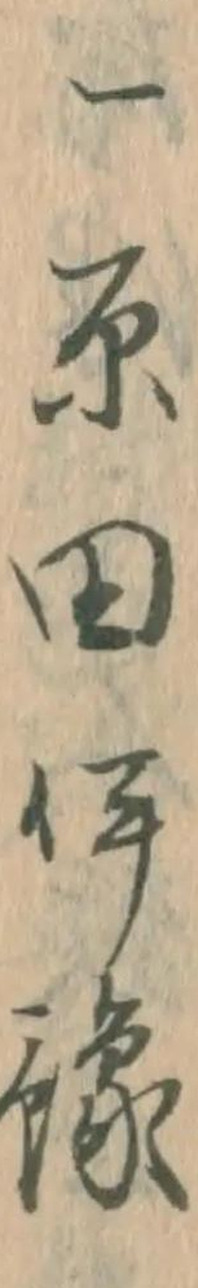一原田伊豫

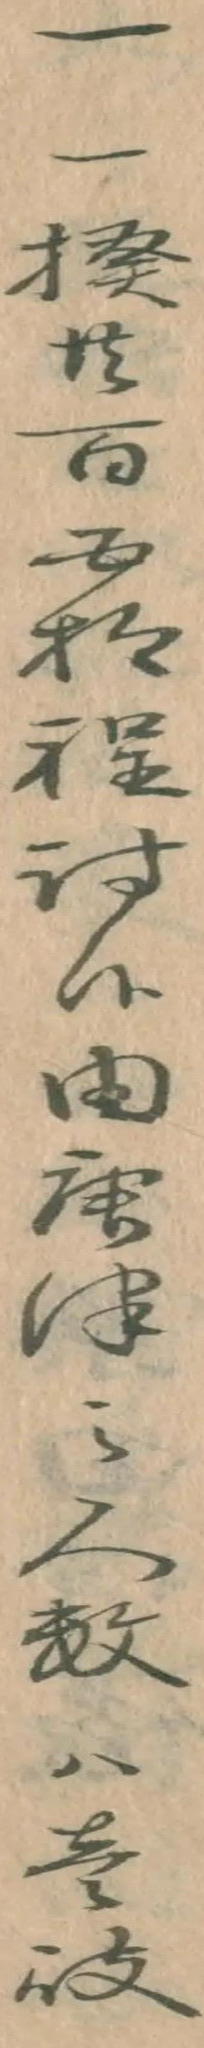一一揆共百五拾程討候由唐津之人数は壱岐
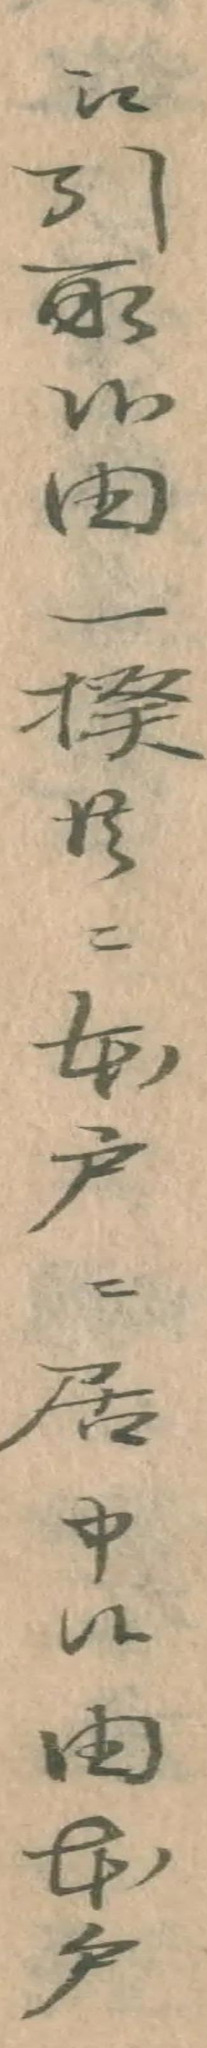江引取候由一揆共に本戸に居申候由本戸
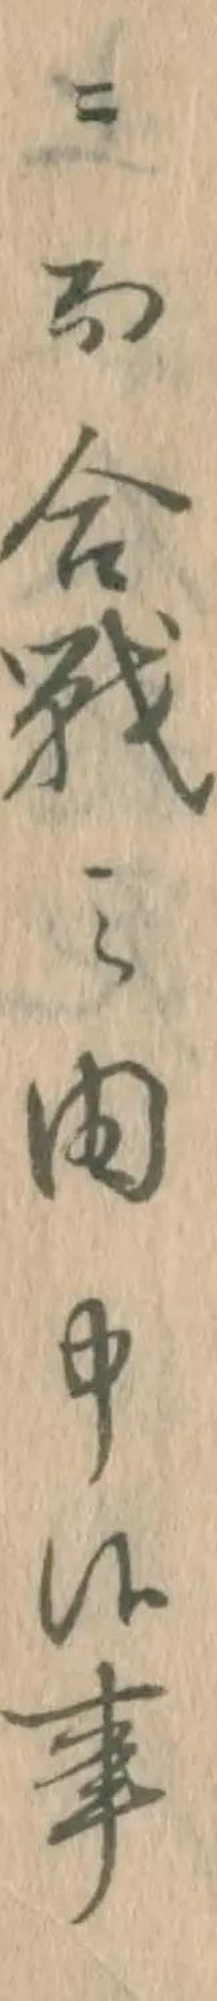に而合戦之由申候事
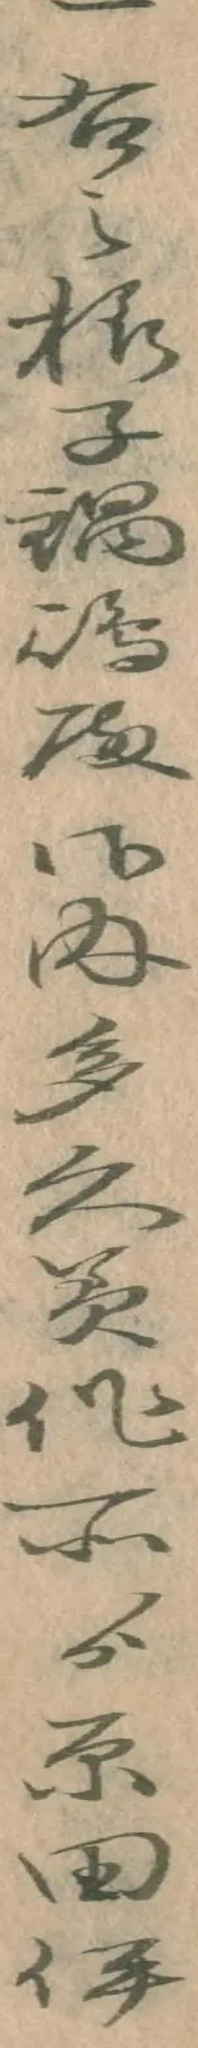一右之様子鍋島殿御内多久美作所ゟ原田伊
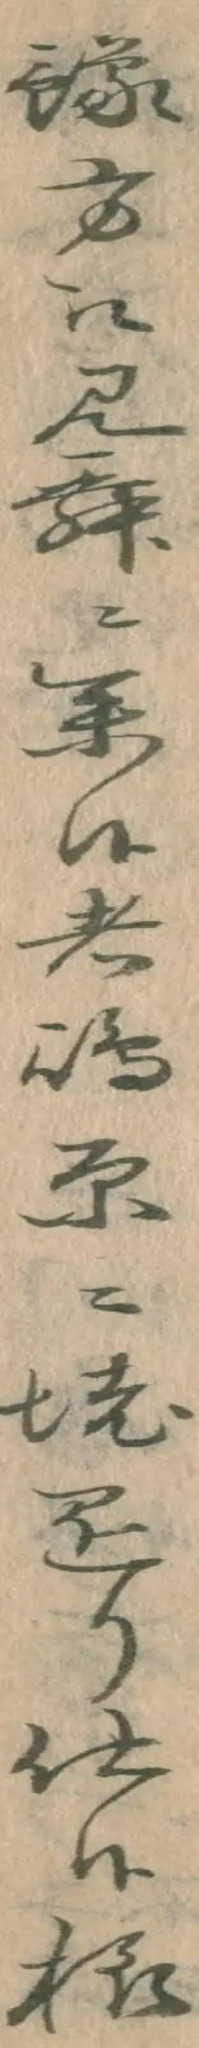豫方江見舞に参候者島原に堵懸り仕候様
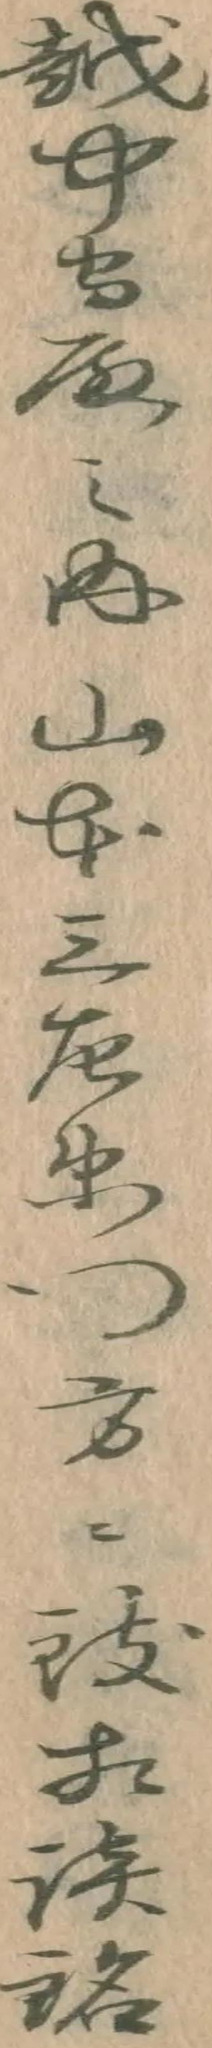越中守殿之内山本三左衛門方に致相談銘
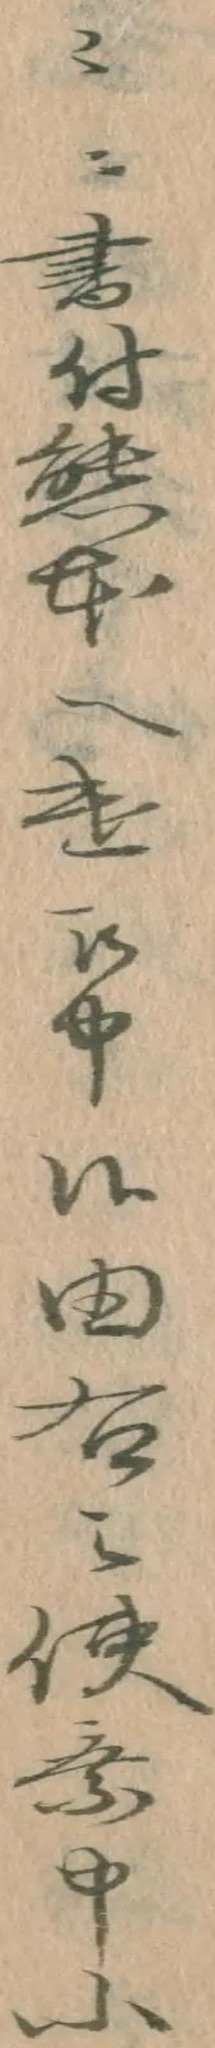々に書付熊本へ遣被申候由右之使乗申小
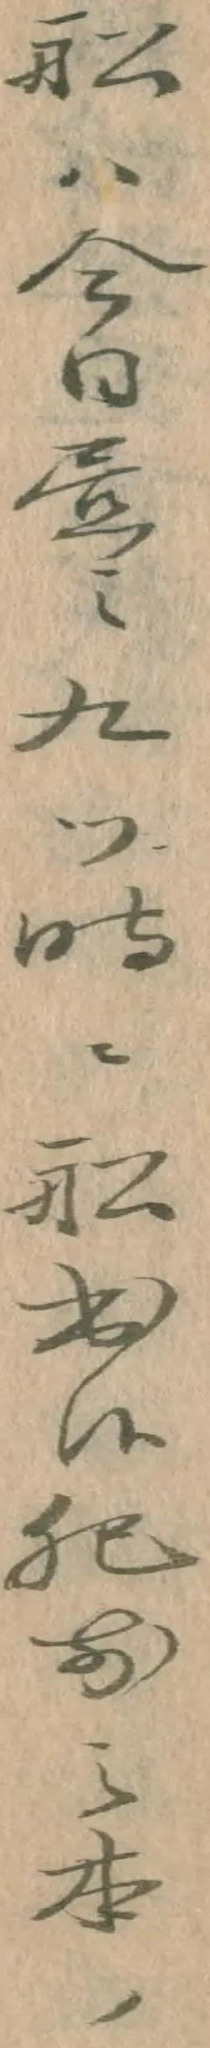船は今日昼之九ッ時に船出候肥前之本ノ
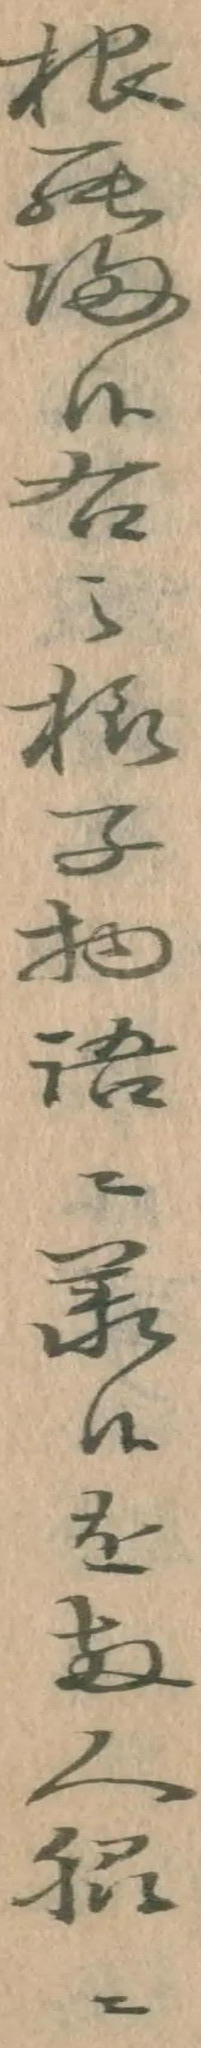根罷帰候右之様子物語に承候を両人脇に
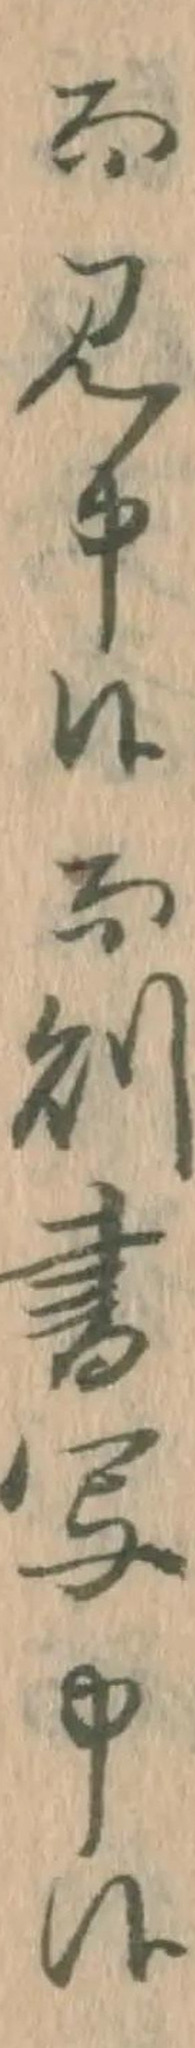而見申候而即書写申候
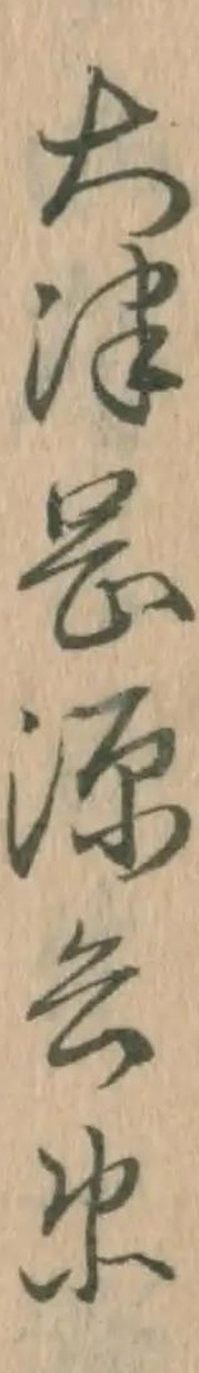大津岡源兵衛
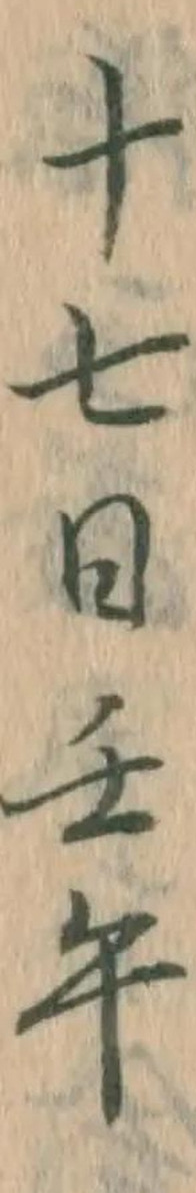十七日壬午
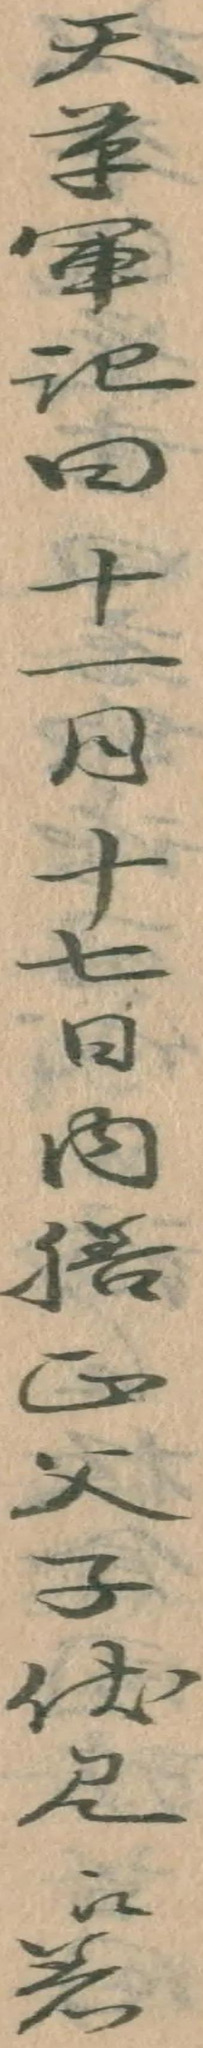天草軍記曰十一月十七日内膳正父子伏見江着
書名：切支丹御退治記 49巻. [3]
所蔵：国立国会図書館 National Diet Library, JAPAN
